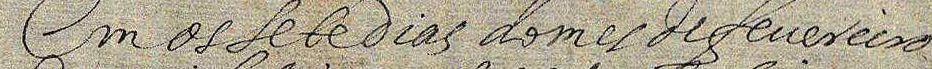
Em os sete dias do mes de feuereiro
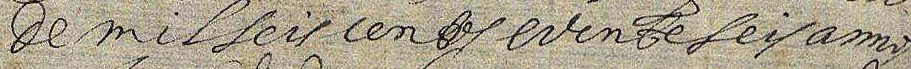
de mil seiscentos e vinte seis annos
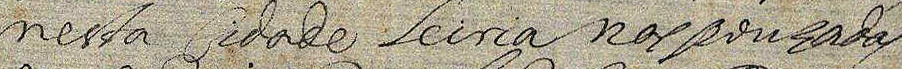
nesta Cidade Leiria nas pouzadas
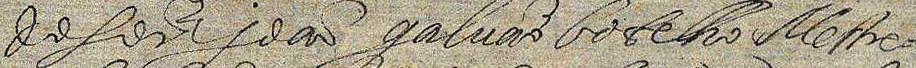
do sor̄ Joaõ galuaõ botelho Mestre
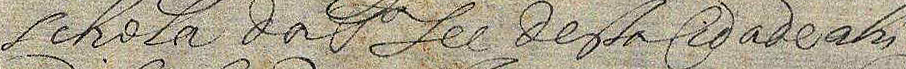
schola da sta see desta Cidade ahi
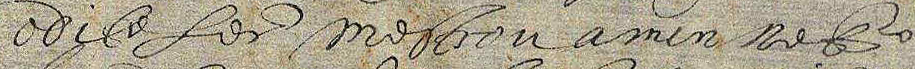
o dito sor̄ mostrou a min notro
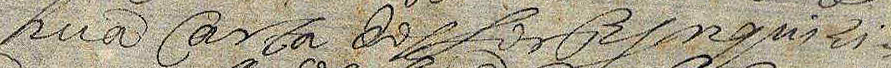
huā Carta dos sors̄ Jnquizi
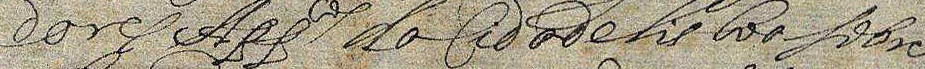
dores Appcos da Cidade Lisboa sobre
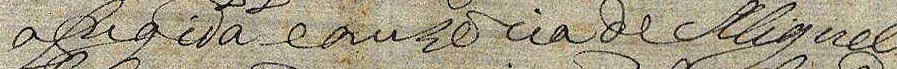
a fugida e auzēcia de Miguel
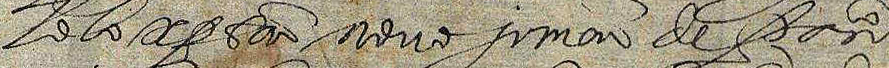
lobo xptão nouo jrmão de franco
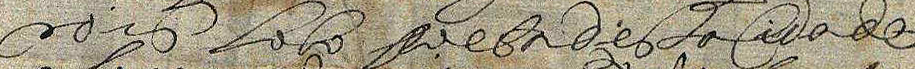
rois̄ Lobo poeta desta Cidade
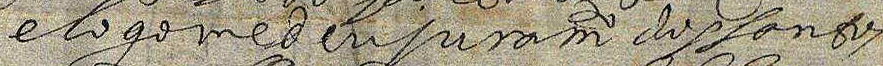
e logo me deu juramto dos santos
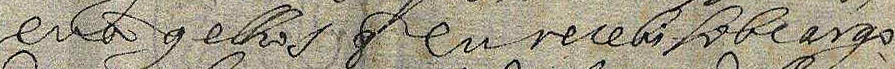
euāgelhos q̄ eu recebi sob cargo
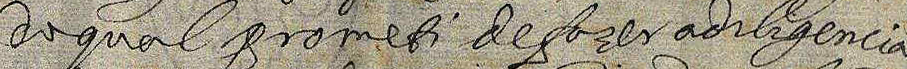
do qual prometi de fazer a diligencia
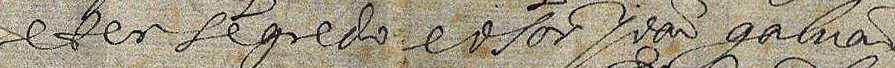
e ter segredo e o sor̄ joão galuaõ
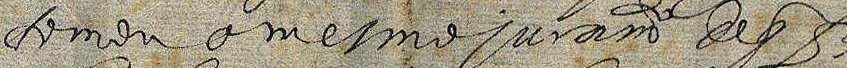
tomou o mesmo juramto de q̄ fis
